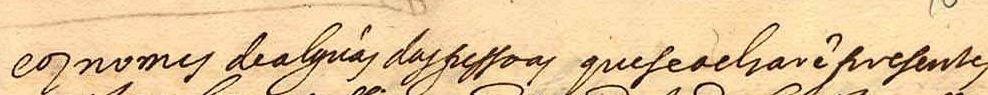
e os nomes de alguās das pessoas que se acharē presentes
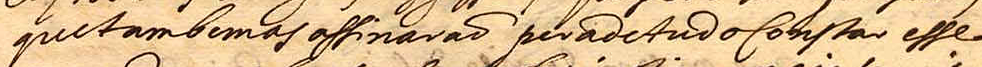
que tambem as assinaraõ pera de tudo Constar esse
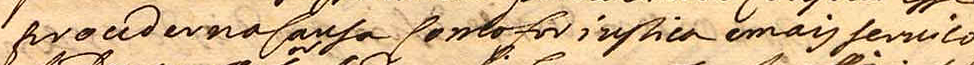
proceder na Causa Como for iustica e mais seruico
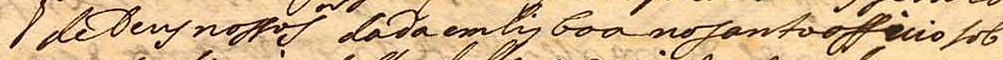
de Deus nosso Sor dada em lisboa no Santo officio sob
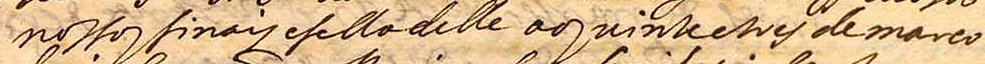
nossos sinais e sello delle aos uinte e tres de marco
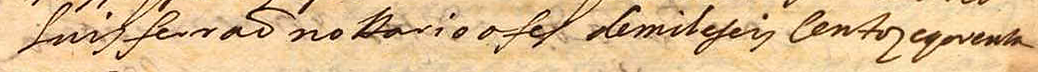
Luis ferraõ nottario o fes de mil e seiscentos e qorenta
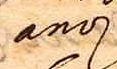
anos
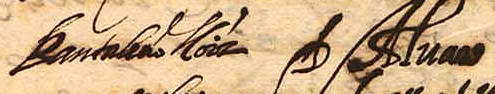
Pantaleaõ Roiz̄ D Aluaro
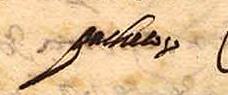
pacheco
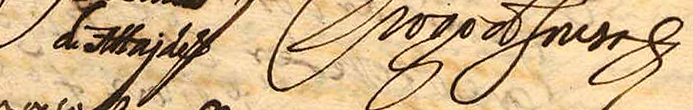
de Attaide Diogo d Sousa
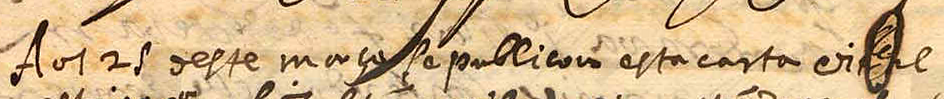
Aos 25 deste março se publicou esta carta edital
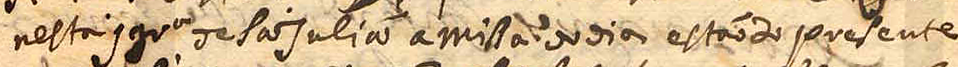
nesta jgra de Saõ Juliaõ a missa do dia estaõ de presente
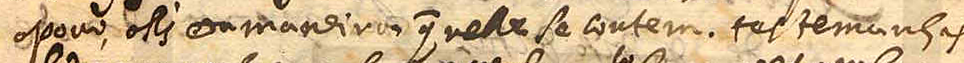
o pouo, assi da maneira q̄ nella se contem. testemunhas
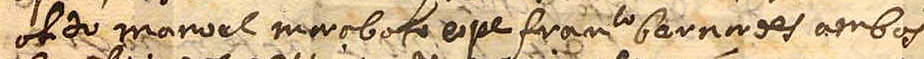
o Ldo manoel maroboto e o pe fran.co bernardes ambos
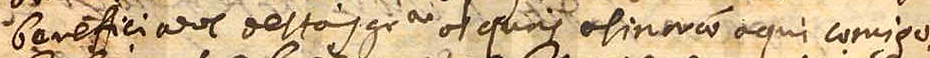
benefficiados desta jgr.a os quais asinaraõ aqui comigo,
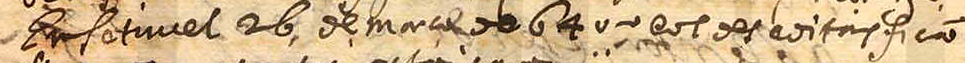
En Setuuel 26, de março de 640 e os dos editais ficaõ
